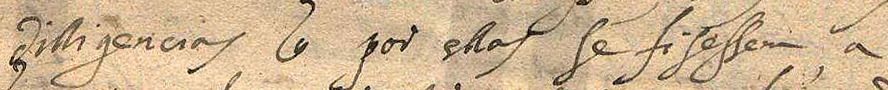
dilligencias q̄ por Ellas se fisessem a
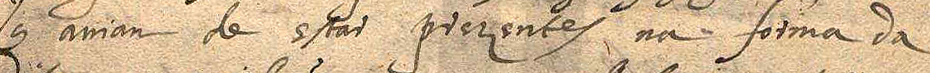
q̄ auiam de Estar prezentes na forma da
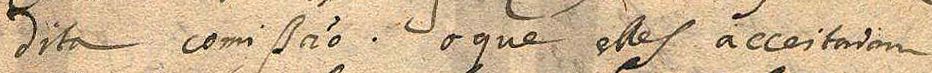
dita comissaõ. o que elles acceitaram
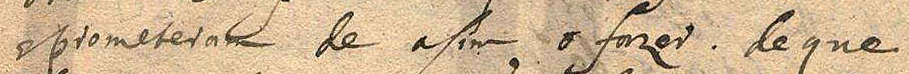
E prometeram de asim o fazer. de que
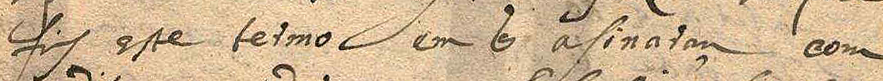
fis Este termo em q̄ asinaram com
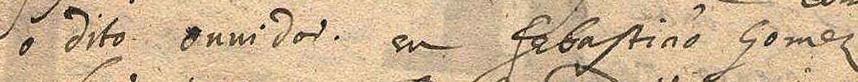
o dito ouuidor. Eu sebastiaõ Gomez
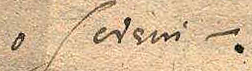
o screui -.
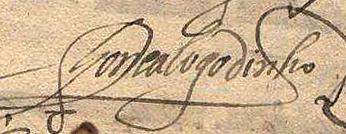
Gonçalo Godinho
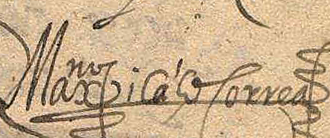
Maxno picāço Correa
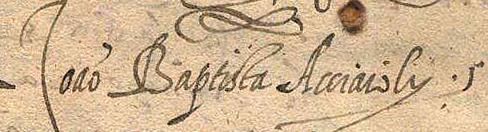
Joaõ Baptista Acciaioly
